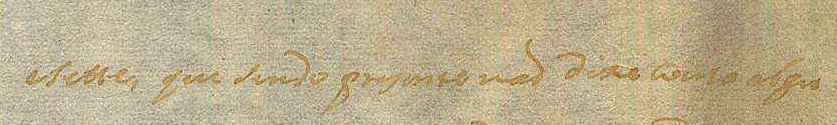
e sette, que sendo presente naõ disse cousa algu
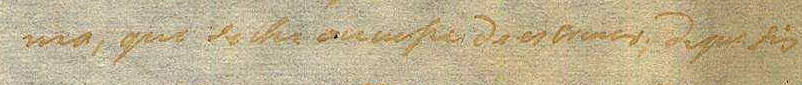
ma, que se lhe ouuesse de escreuer, de que fis
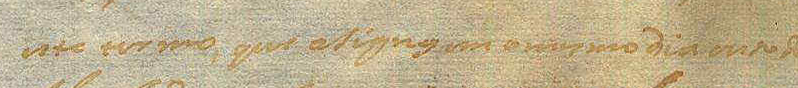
este termo, que asignej em o mesmo dia outo de
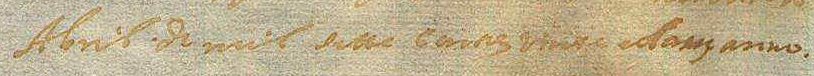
Abril de mil settecentos vinte e dous anno.
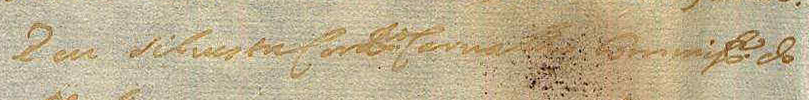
& eu siluestre Cord̄.ro Carualho Commiss.ro do
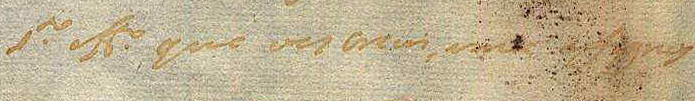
s.to off.o, que o escreui, e me assignej
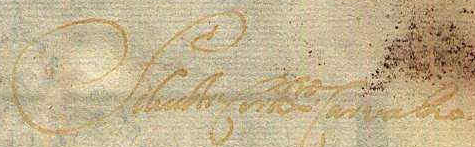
Siluestre Cord.ro Carualho
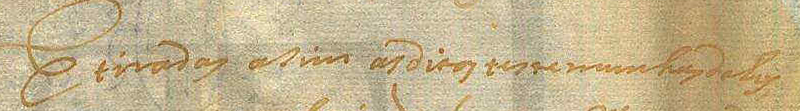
E tiradas asim as ditas testemunhas dahy
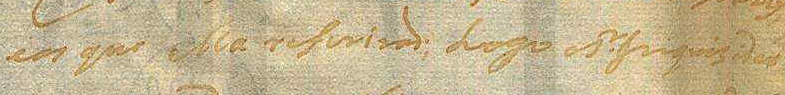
e os que ella referiraõ, Logo o s.r Jnquisidor
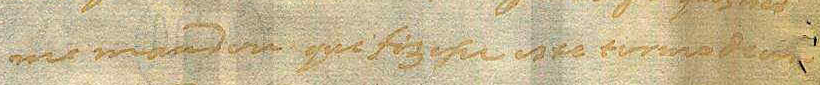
me mandou que fizesse este termo de en
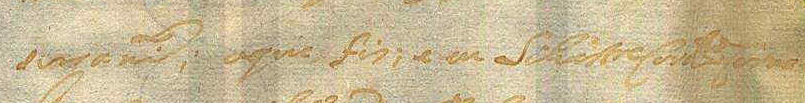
seram.to; o que fis; e eu Siluestre Cord̄.ro Carua
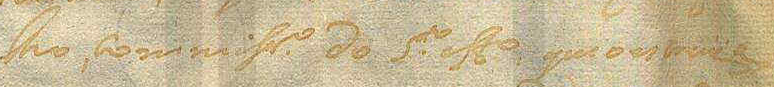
lho, commissr.o do S.to off.o que o escreui
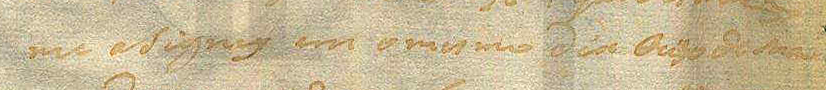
me asigney em o mesmo dia outo de Mar
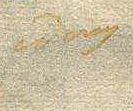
e dous
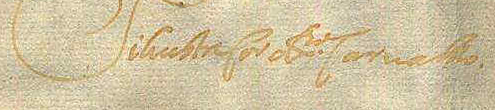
Siluestre Cord̄.ro de Carualho
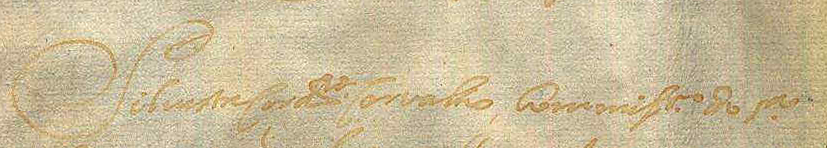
Siluestre Cord.ro Carualho, Commissr.o do s.to
